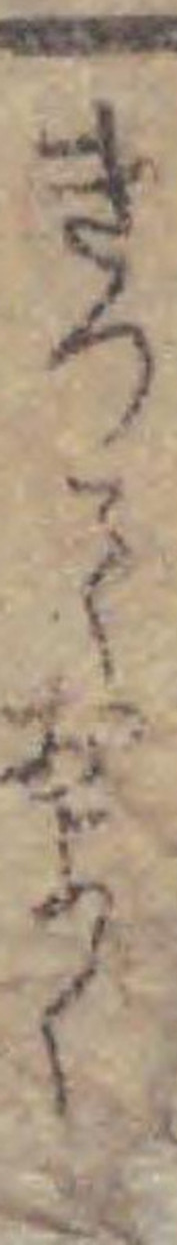きつておよく
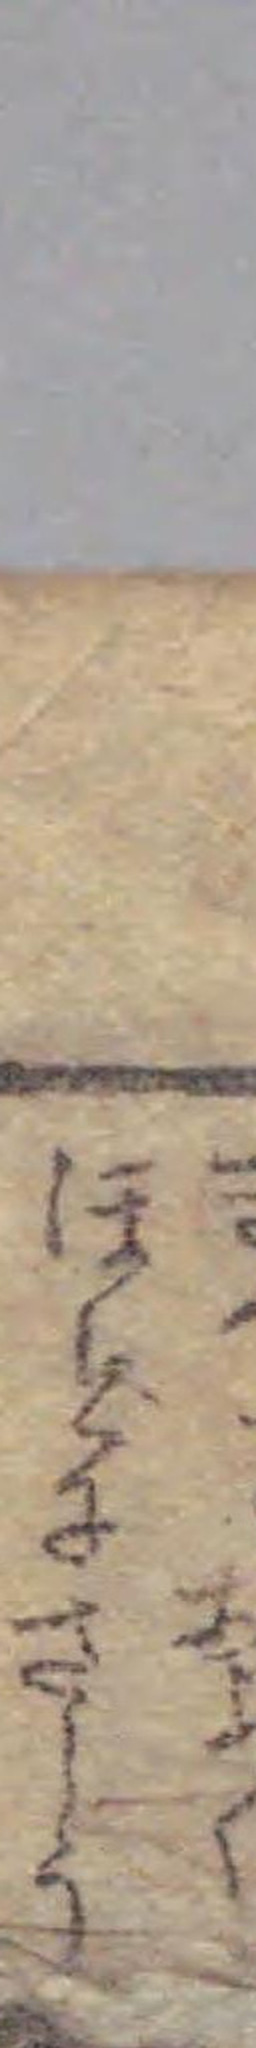ほとにさしう
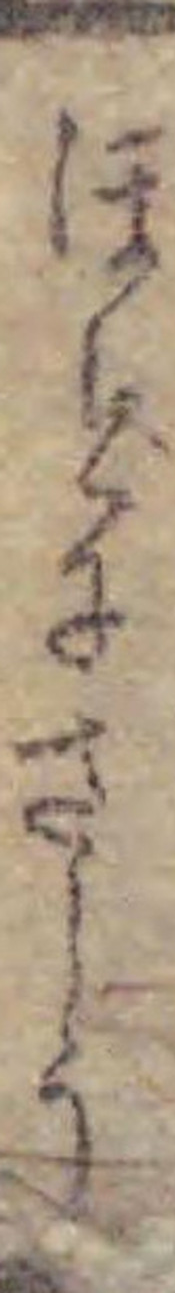ほとにさしう
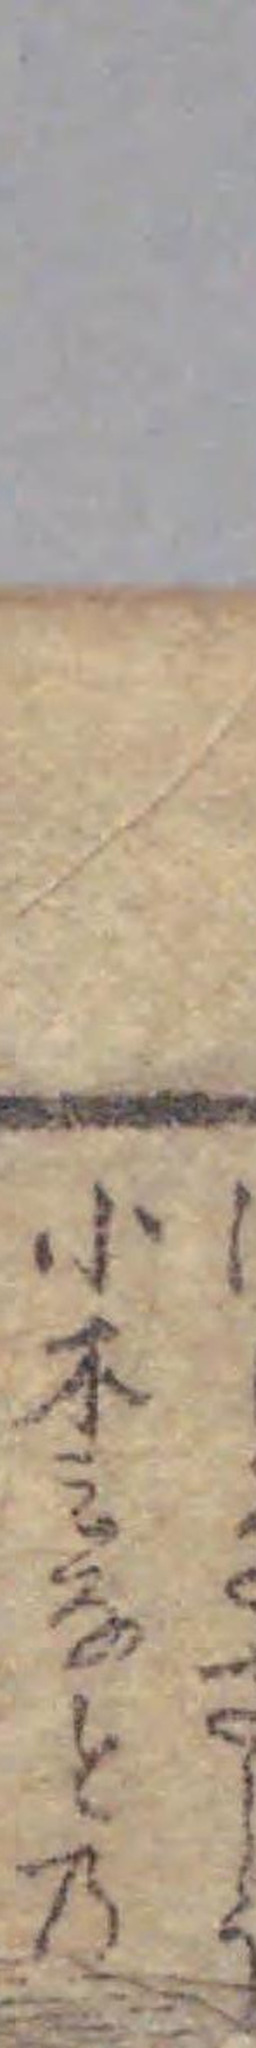小木みなとの
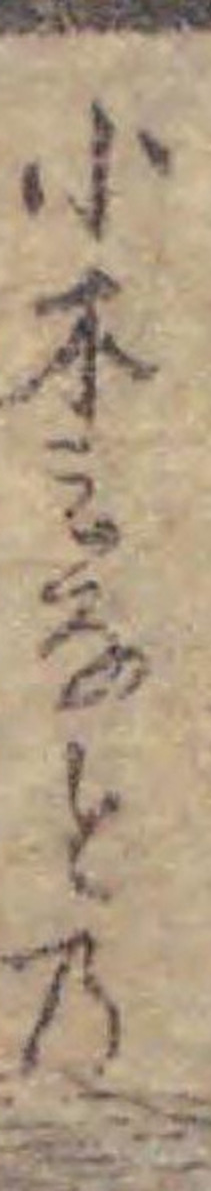小木みなとの
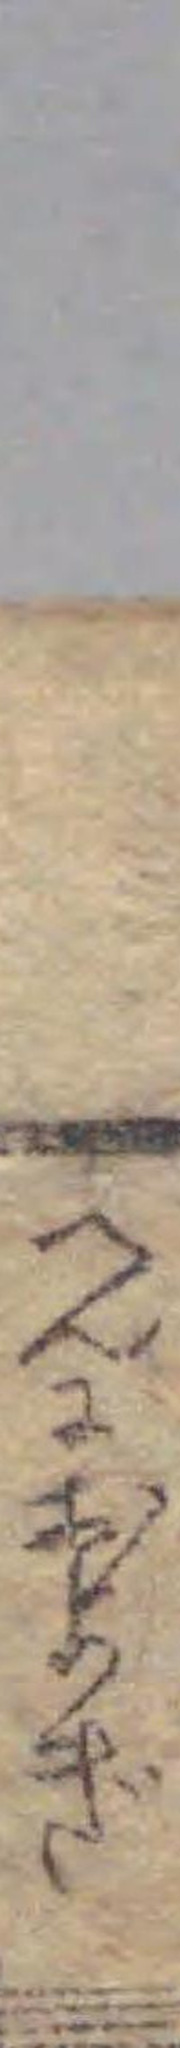へんにおよぎ
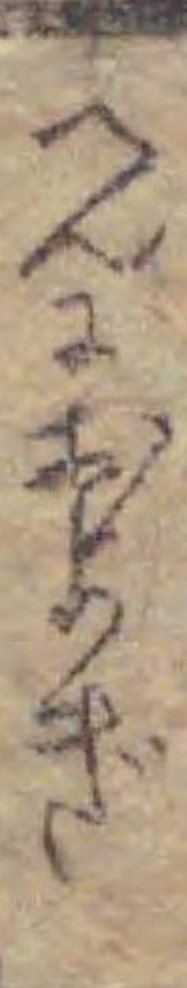へんにおよぎ
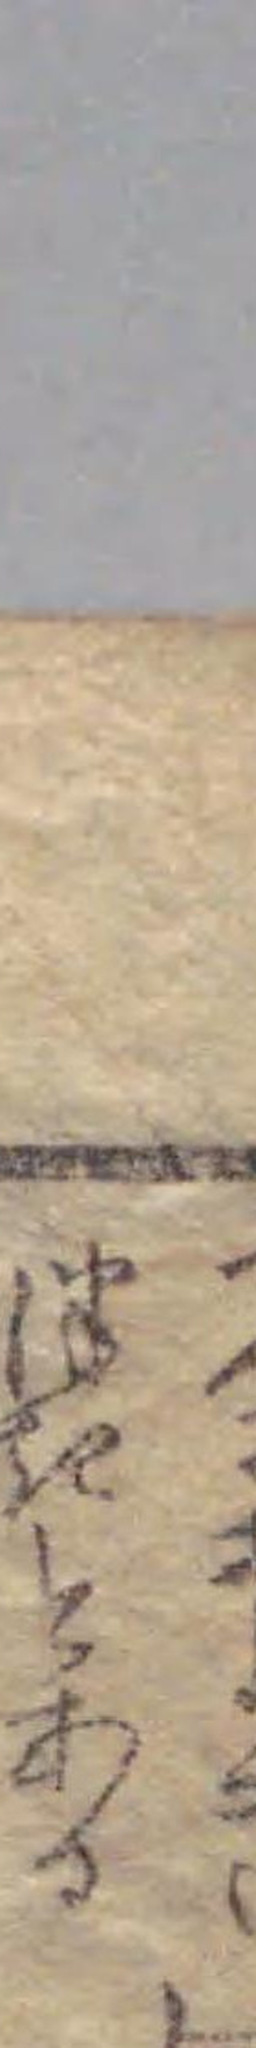つきとある
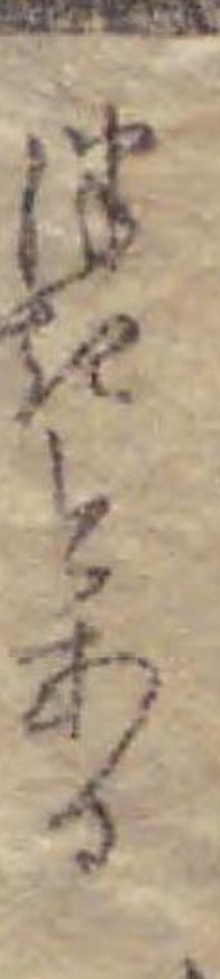つきとある
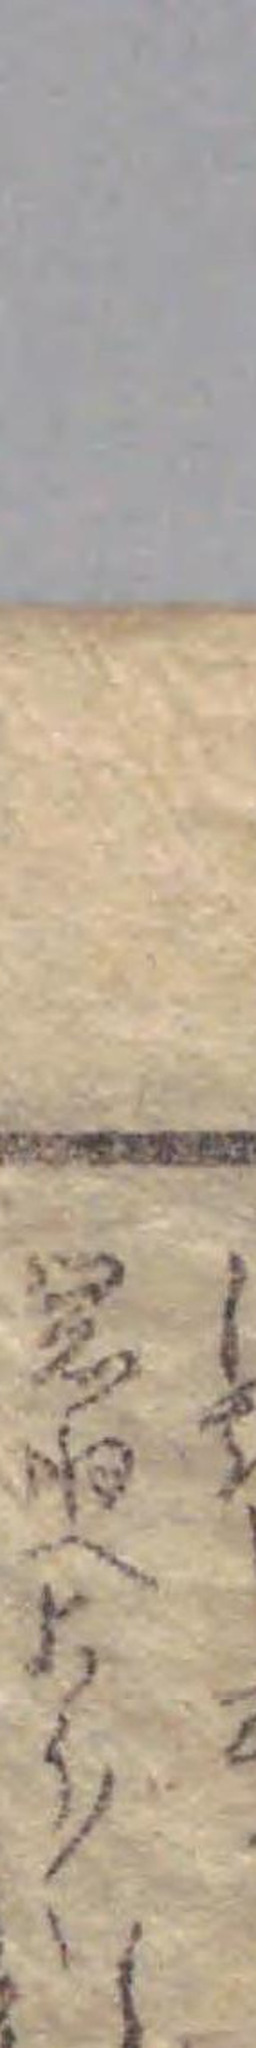岩ねへよう〳〵
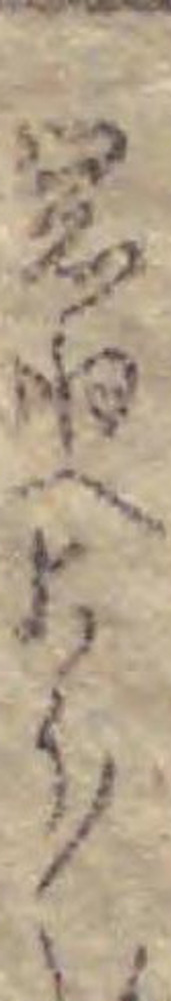岩ねへよう〳〵
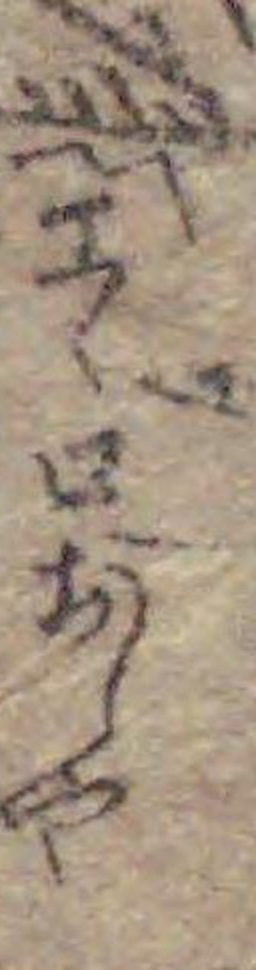〽エヽ口おしや
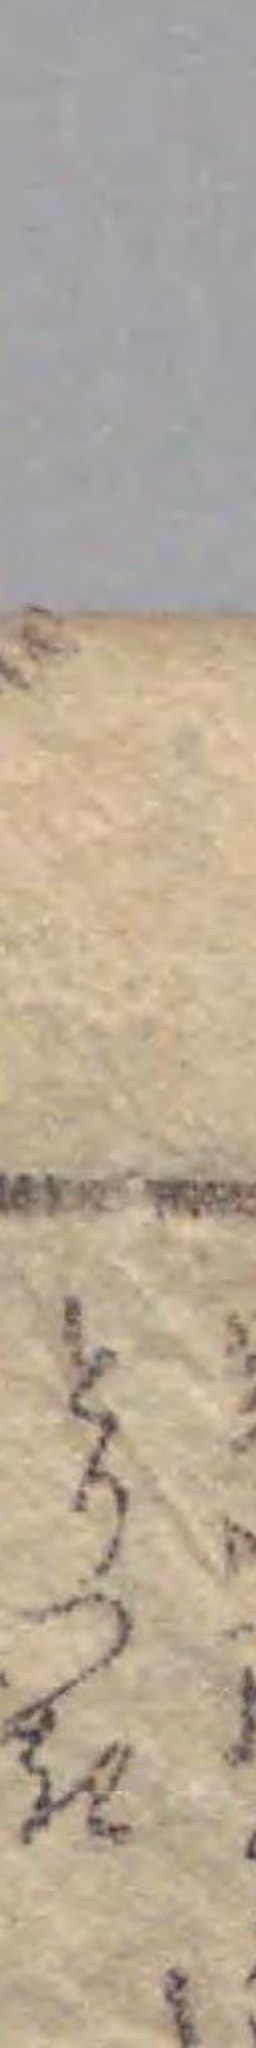とりつき
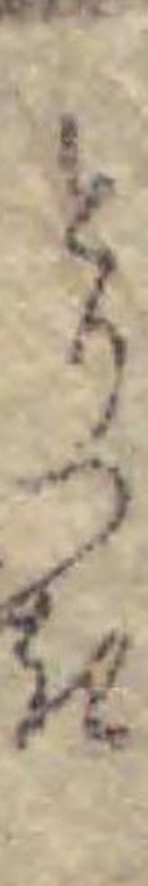とりつき
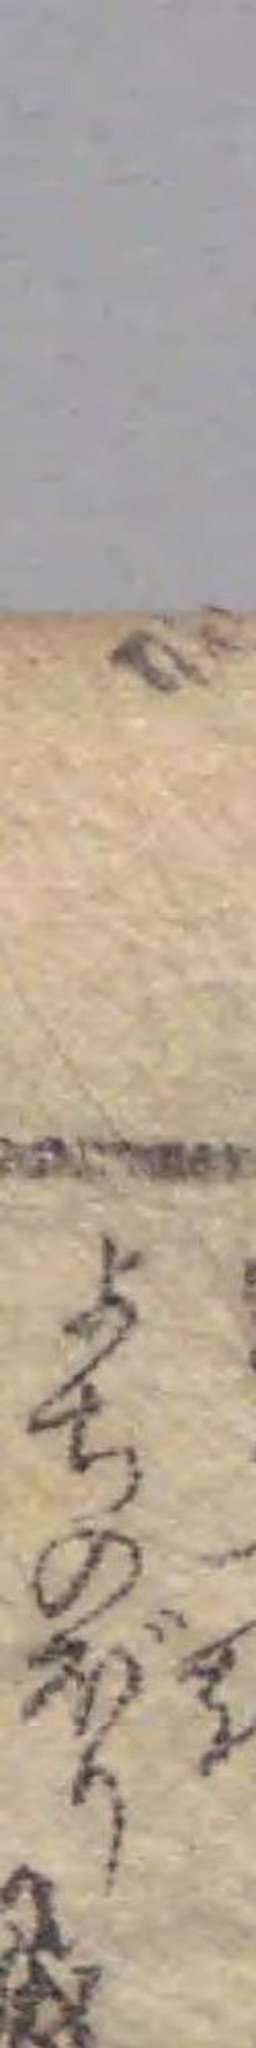よちのぼり
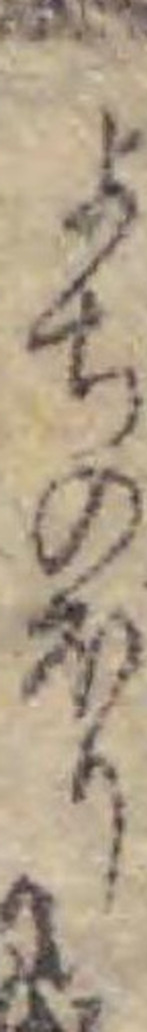よちのぼり
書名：化物世界夜半嵐 : 3巻
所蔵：国立国会図書館 National Diet Library, JAPAN
